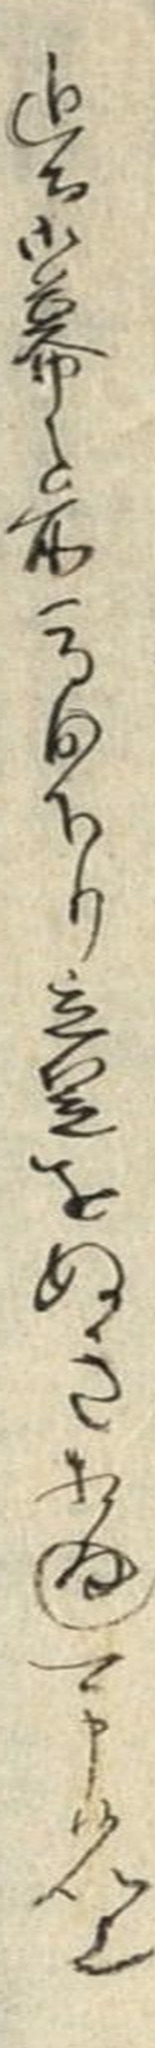追て御幕之前馬ゟ下り立笠をぬき相通可申候以上
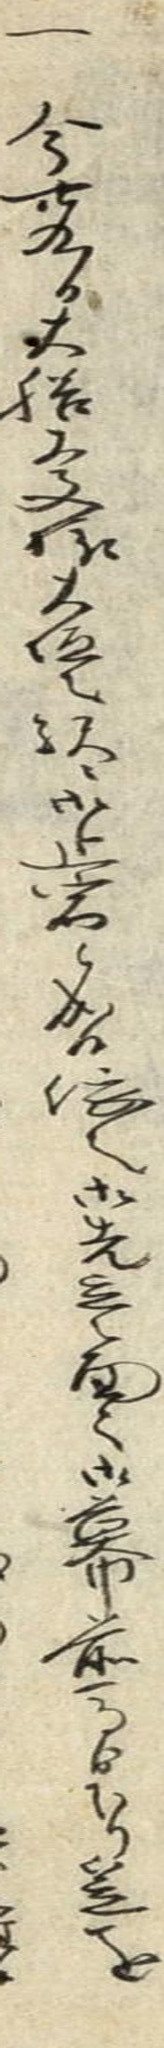一今廿九日ゟ大膳大夫様大垣之駅に御止宿被成候依之御先立之面々御幕前馬ゟ下り笠を
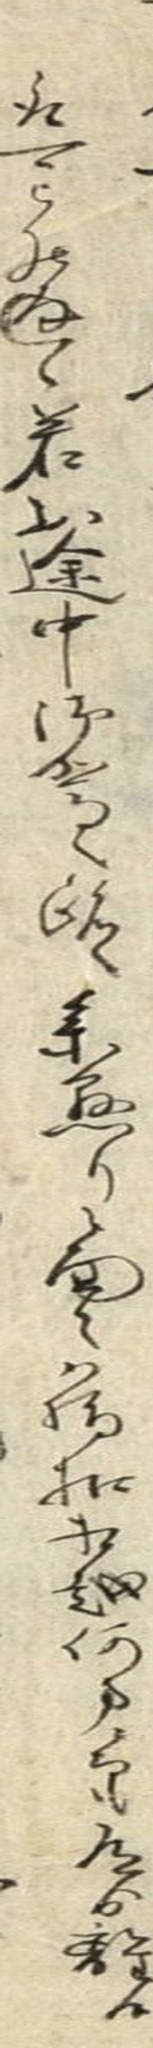取可被罷通候若於途中御駕之跡へ参懸り候面々は指扣相越何方にても道ゟ離候
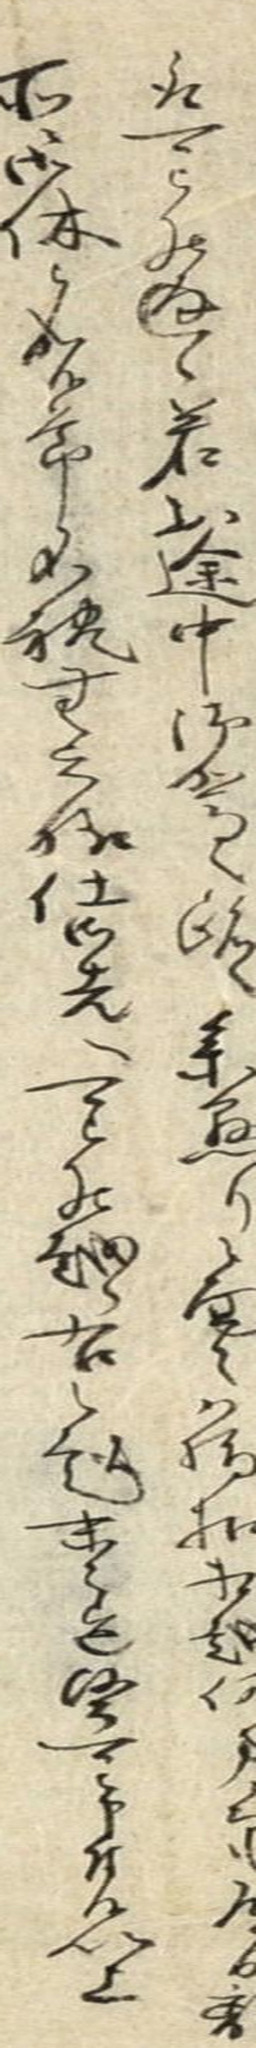所に御休被成候節不礼無之様仕御先へ可被罷越候右之趣末々迄堅可被申付候以上
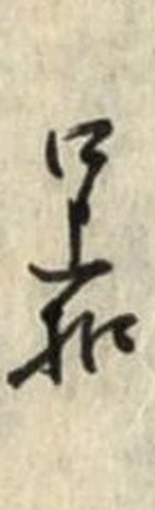口上扣
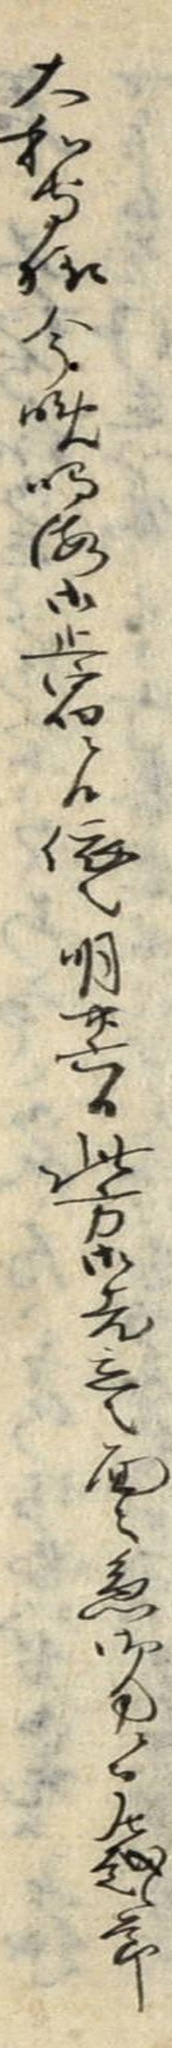大和守様今晩鳴海御止宿に候依之明廿六日此方御先立之面々急御用にて罷越候節

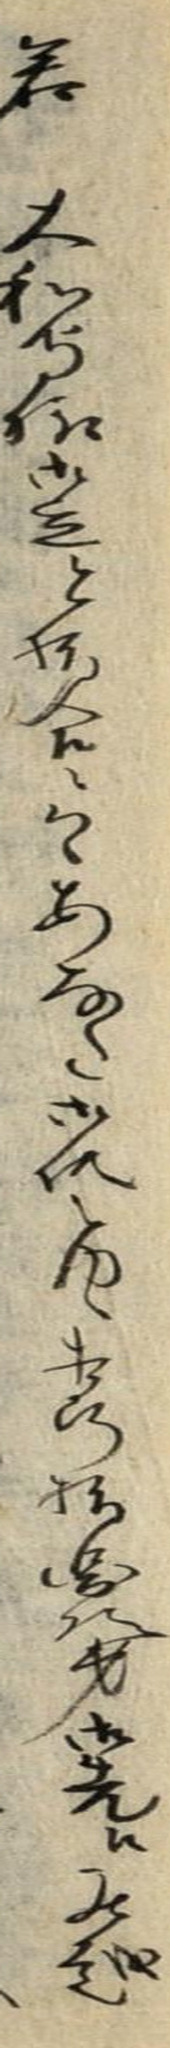若大和守様御立に候指合に候はゝあなた御供之内へ相断指図次第御先江罷越
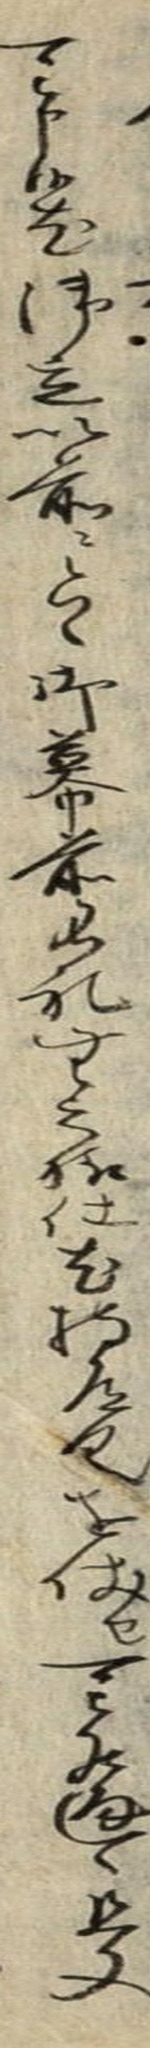可被申候尤御立以前に候はゝ御幕前不礼無之様仕尤持道具を伏せ可被罷通候且又
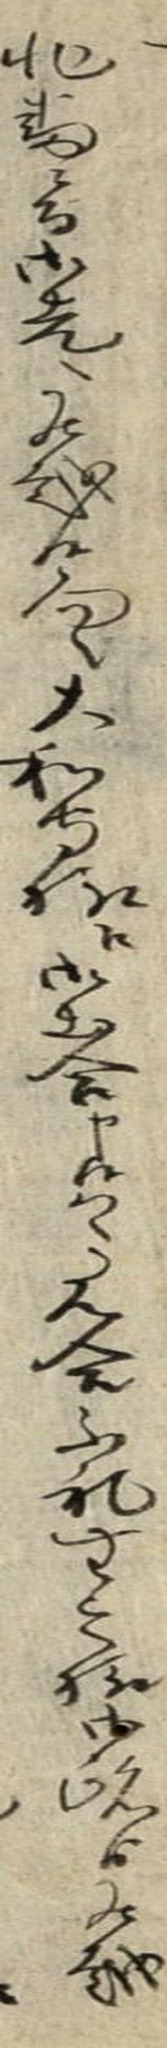非番にて御先へ罷越候向へ大和守様江御出合申候はゝ見合不礼無之様御跡ゟ罷越
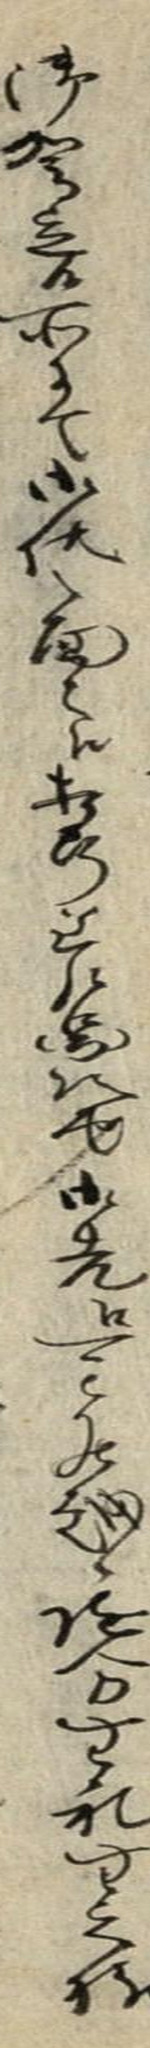御駕立候所にて御供之面々江相断差図次第御先江可被罷越候随分無礼無之様
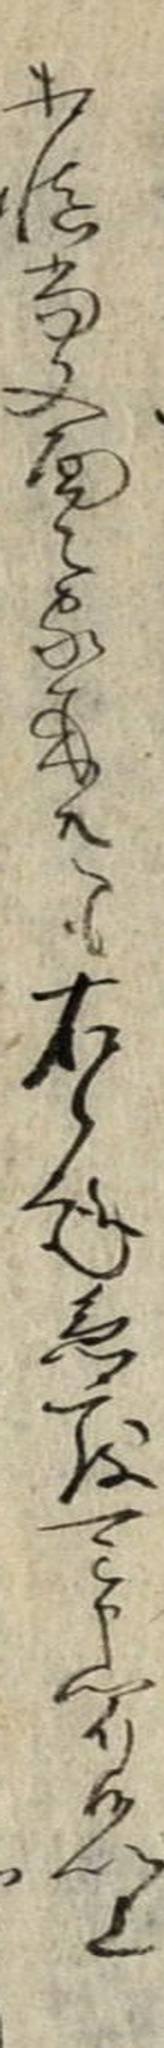相慎尚又面々家来共へも右之趣急度可被申聞候以上
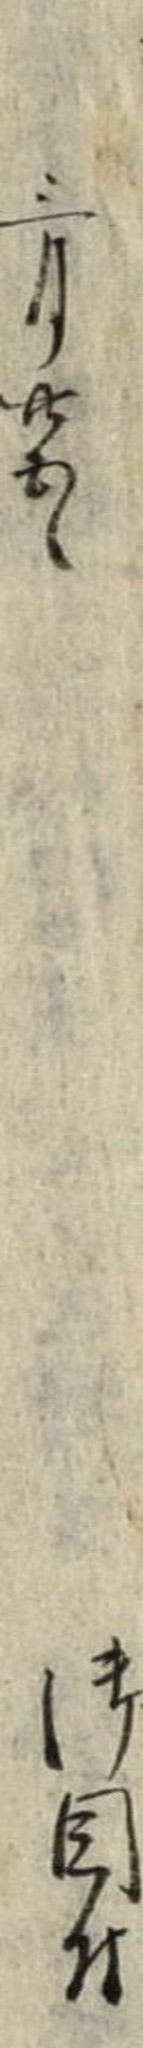三月廿五日御目付
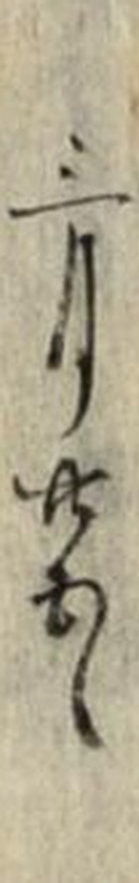三月廿六日
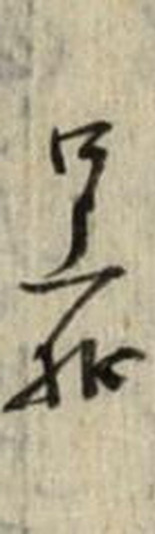口上扣
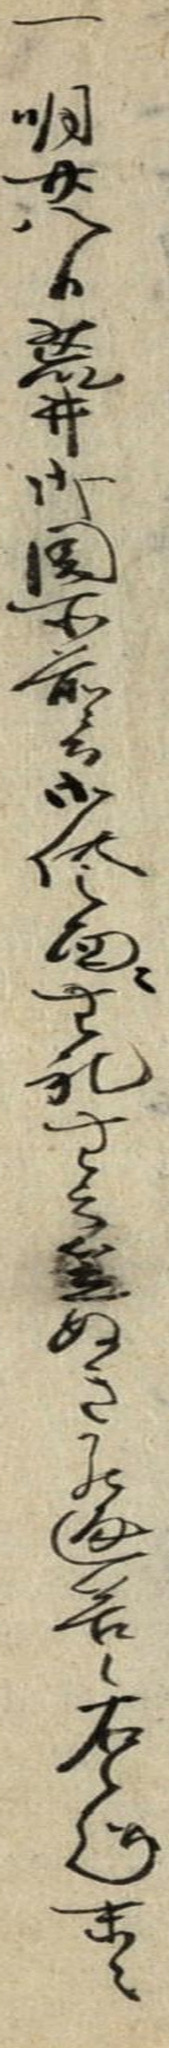一明廿八日荒井御関所前にて御供之面々に無礼無之笠ぬき罷通筈候右之趣末々
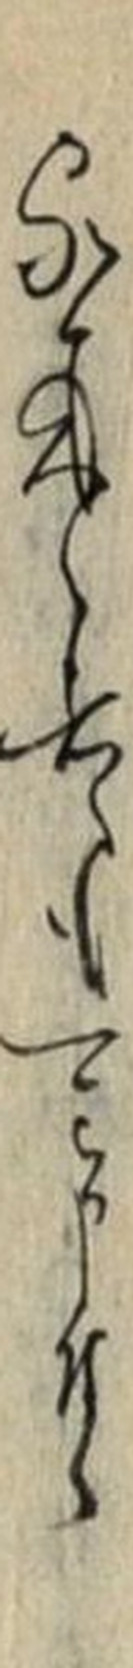家来之者へも可被申付候
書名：三都并道中之部
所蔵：福井県文書館 Fukui Prefectural Archives
